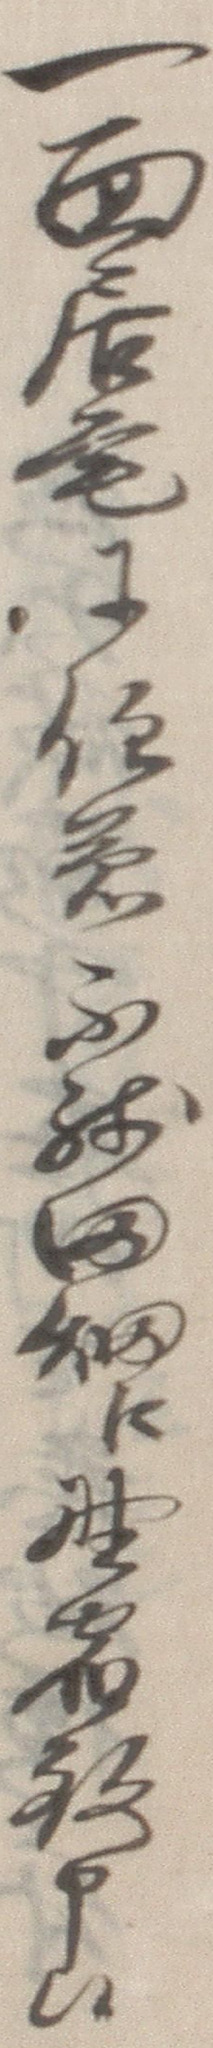一面居宅に住兼不残田畑江野宿致申候
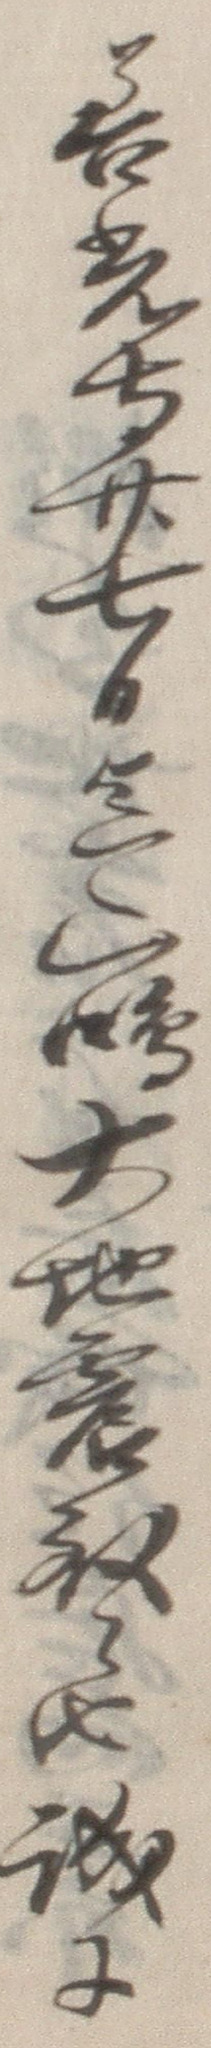善光寺廿七日迄山鳴大地震致之由誠に
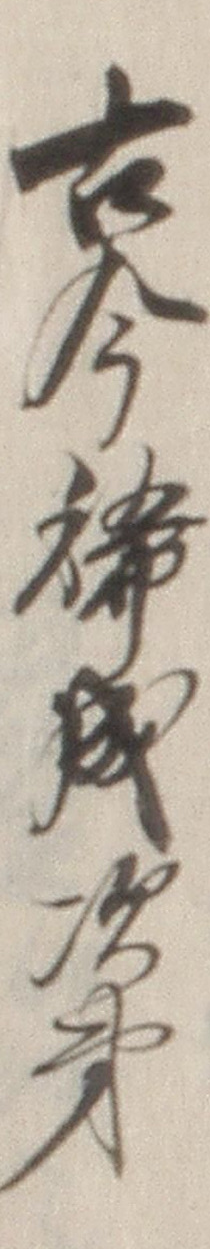古今稀成次第
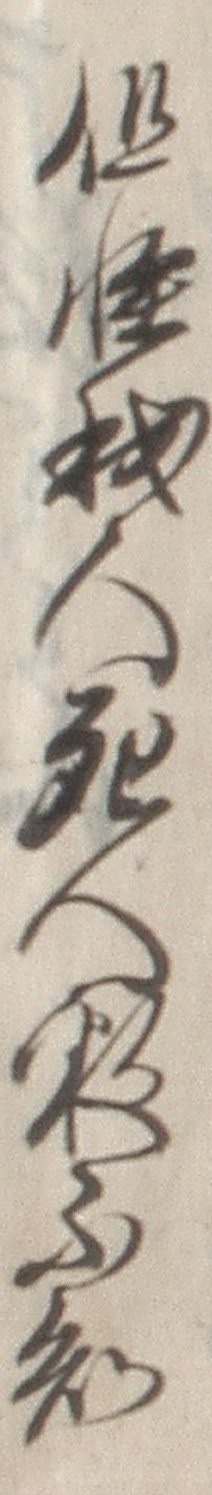但怪我人死人数不知
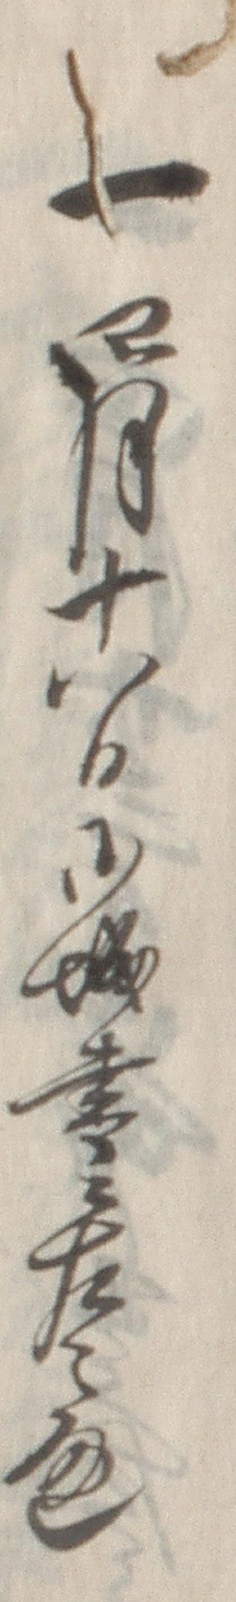一四月十八日御城書二左之通
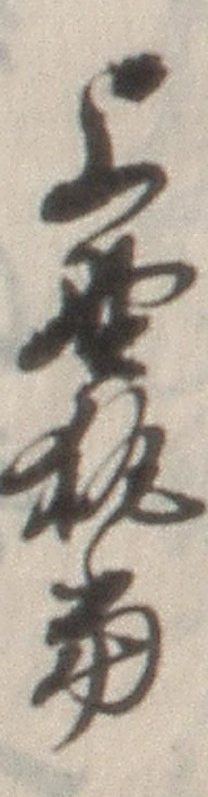上野執当
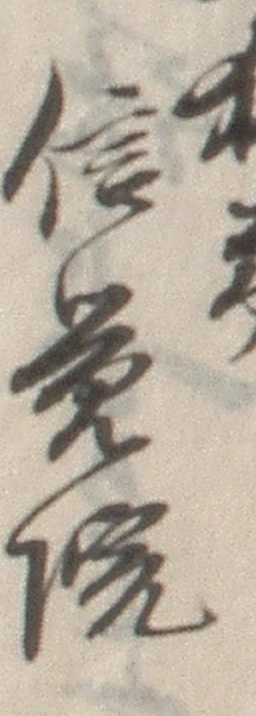信覚院
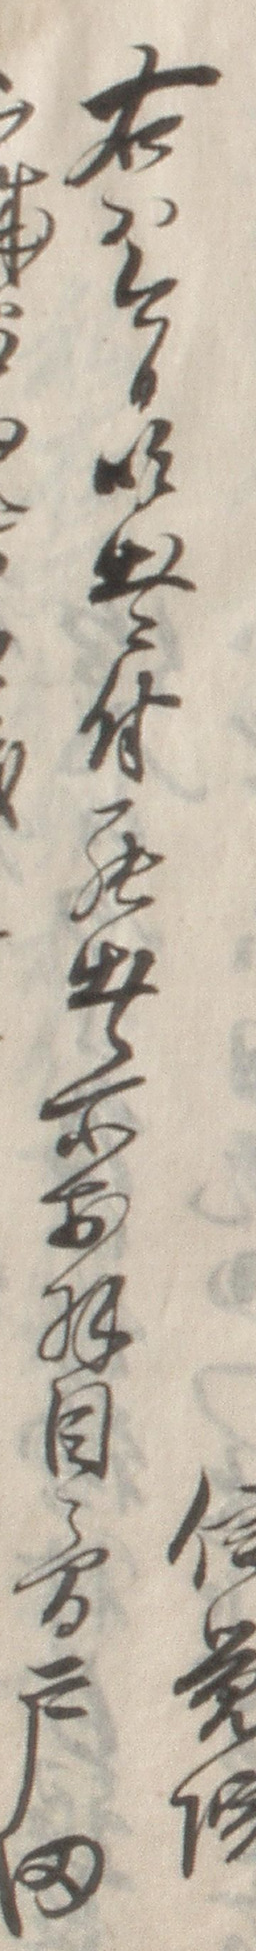右ハ今日呼出二付罷出候所於拝目之間戸田
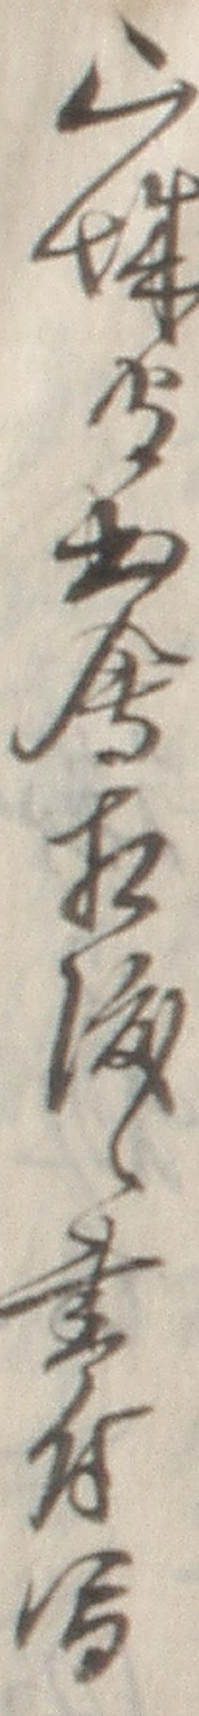山城守出会相渡候書付写
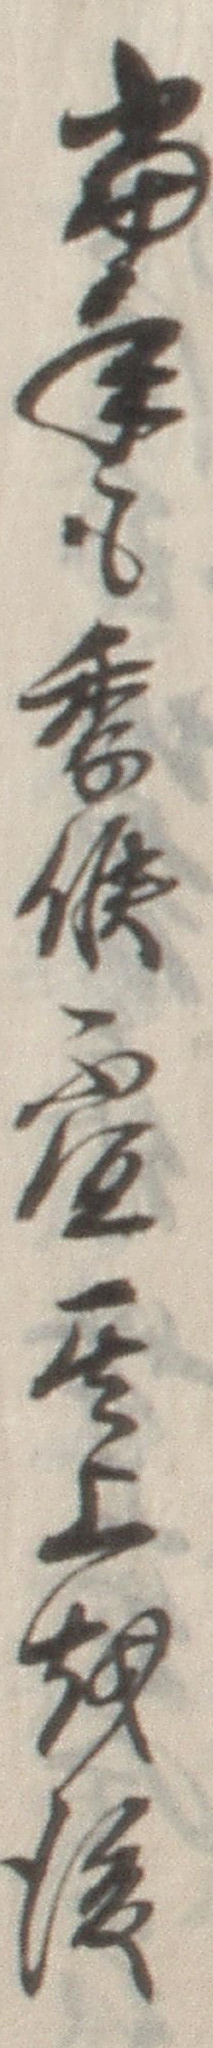当年も季候不宜其上越後

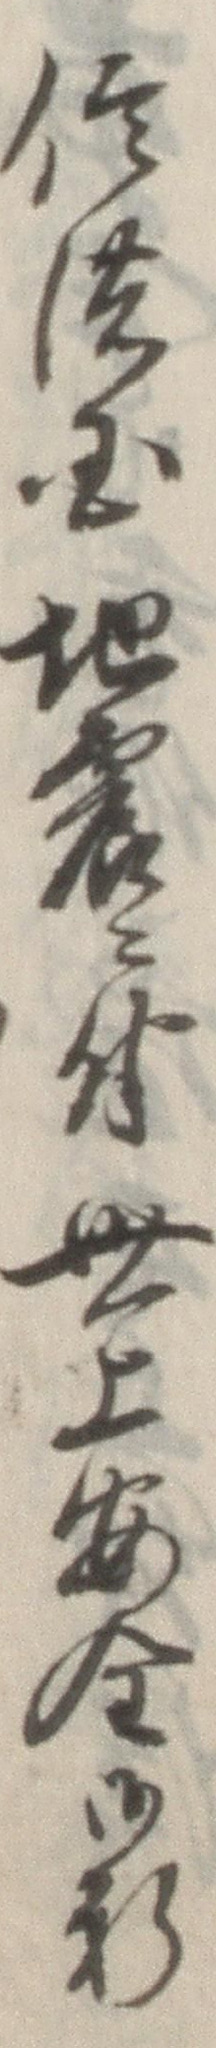信濃国地震二付世上安全御祈
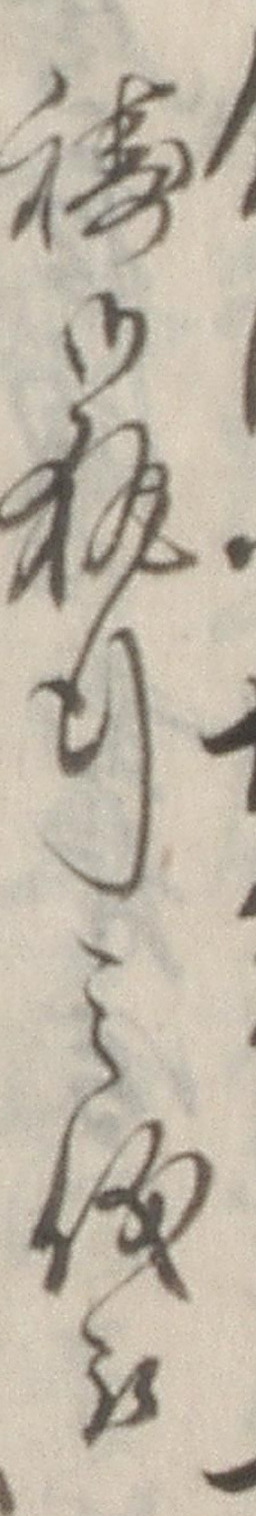祷御執行之儀被
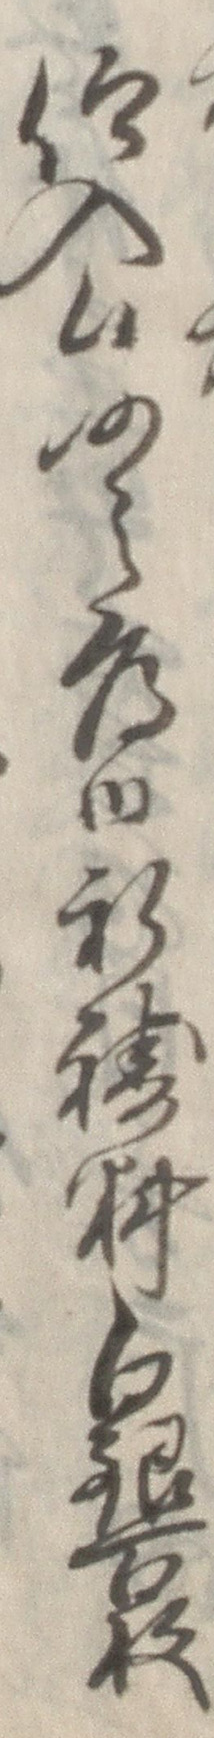仰入候仍之為御祈祷料白銀百枚
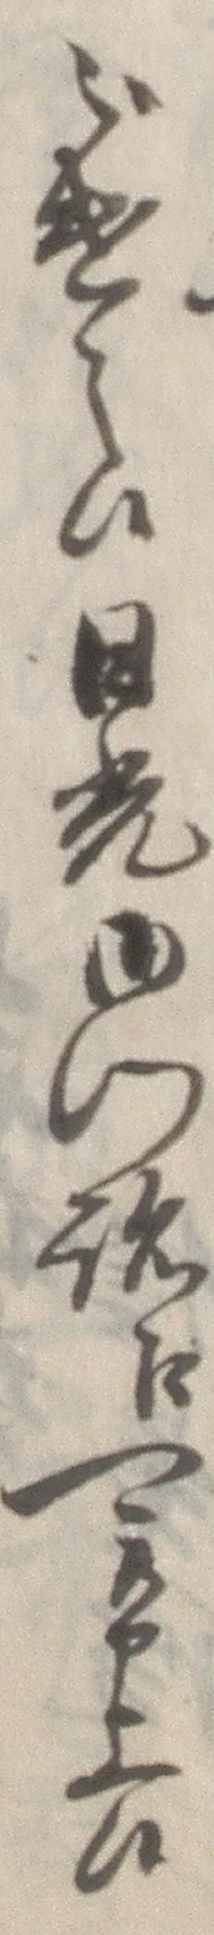被遣之候日光御門跡江可被申上候
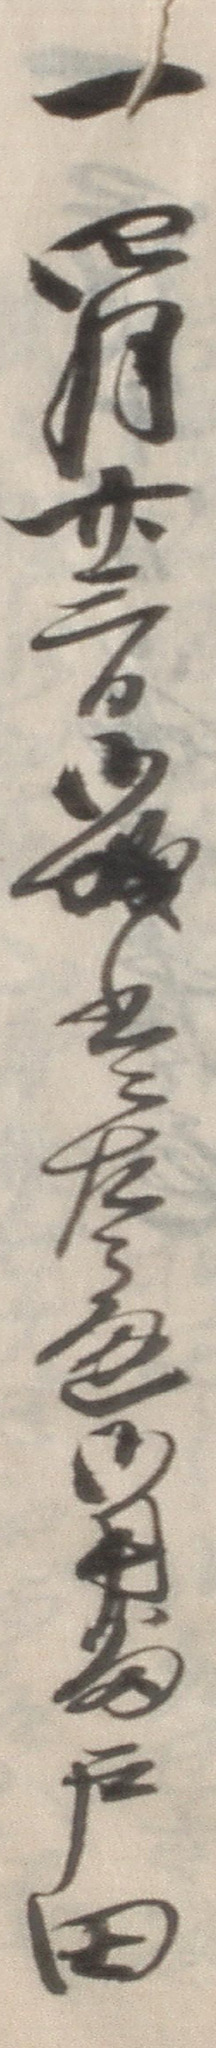一四月廿三日御城書二左之通御用番戸田
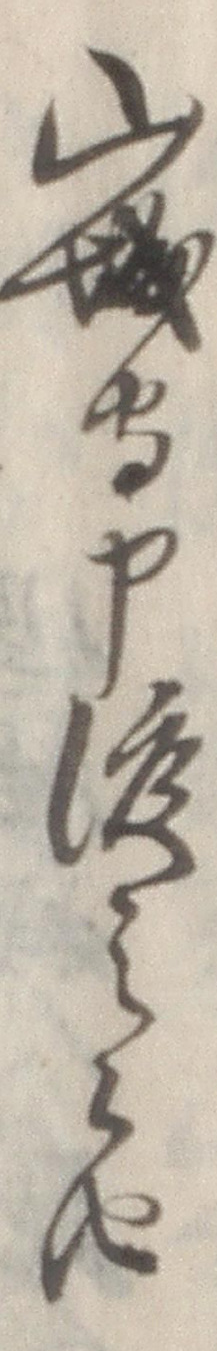山城守申渡之候由
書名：信州地震一件
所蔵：東京大学地震研究所図書室 Earthquake Research Institute Library, The University of Tokyo, JAPAN
